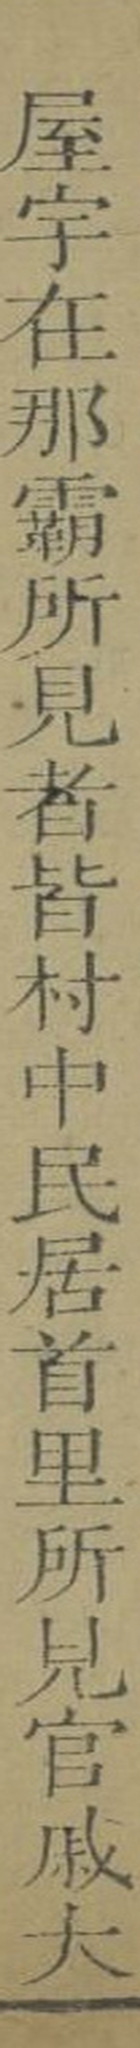屋宇在那霸所見者皆村中民居首里所見官戚大
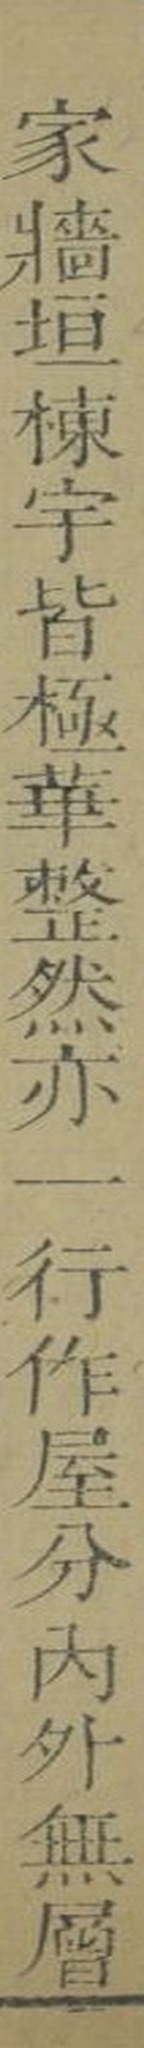家牆垣棟宇皆極華整然亦一行作屋分内外無層
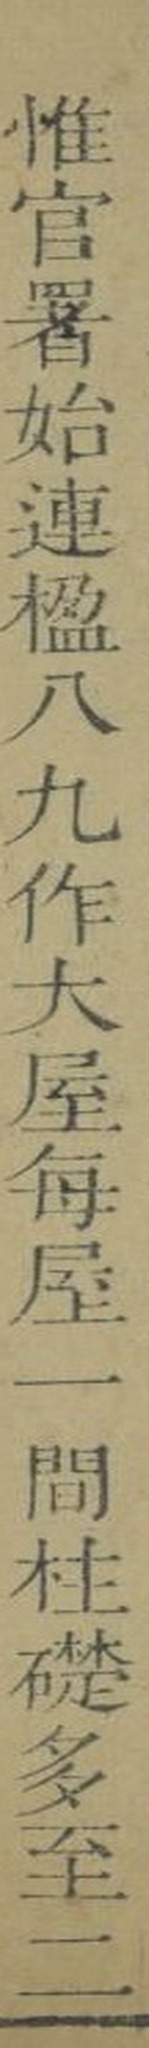惟官署始連楹八九作大屋毎屋一間柱礎多至二
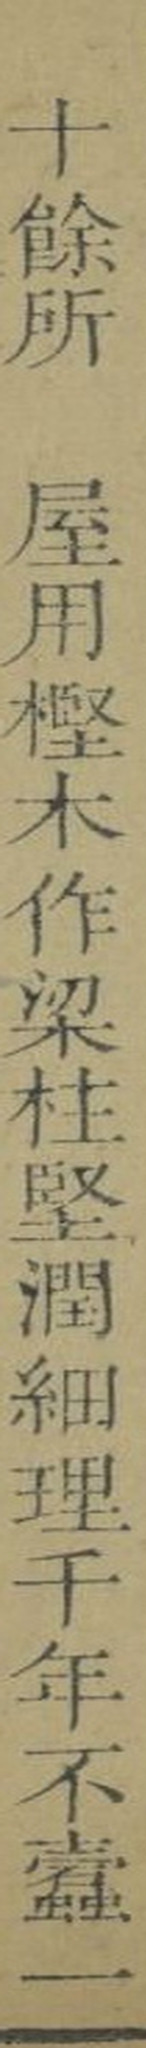十余所屋用樫木作梁柱堅潤細理千年不蠧一
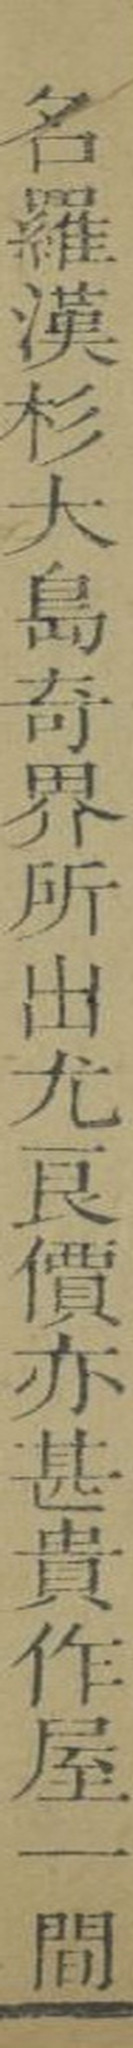名羅漢杉大島奇界所出尤良価亦甚貴作屋一間
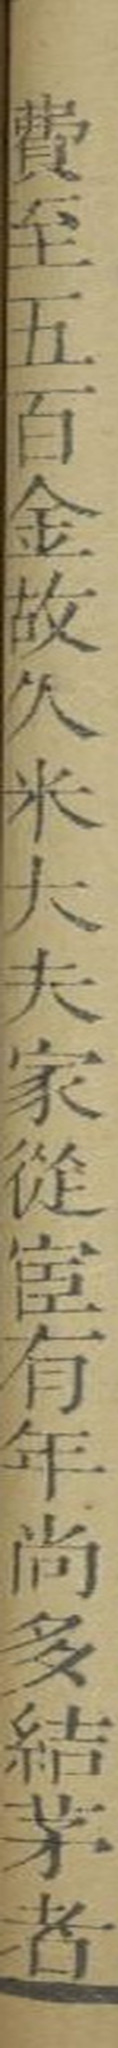費至五百金故久米大夫家従宦有年尚多結茅者
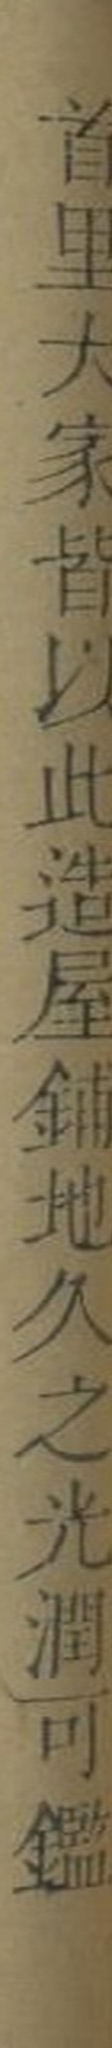首里大家皆以此造屋鋪地久之光潤可鑑
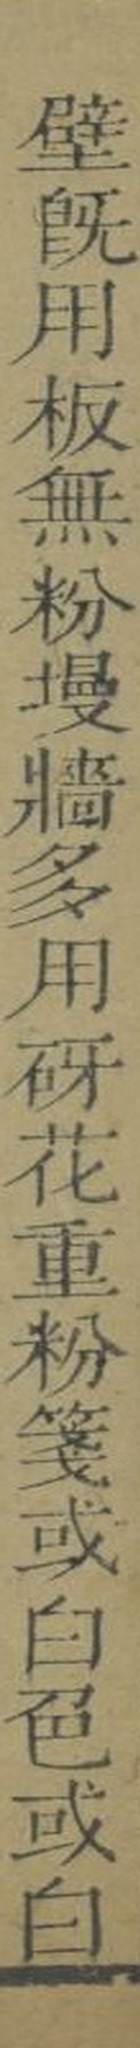壁既用板無粉墁牆多用砑花重粉箋或白色或白
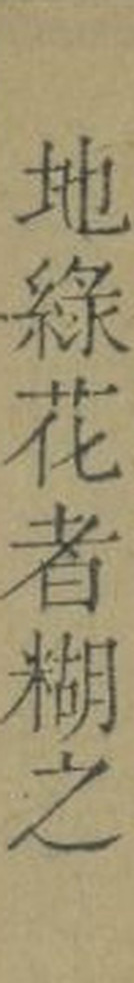地緑花者糊之
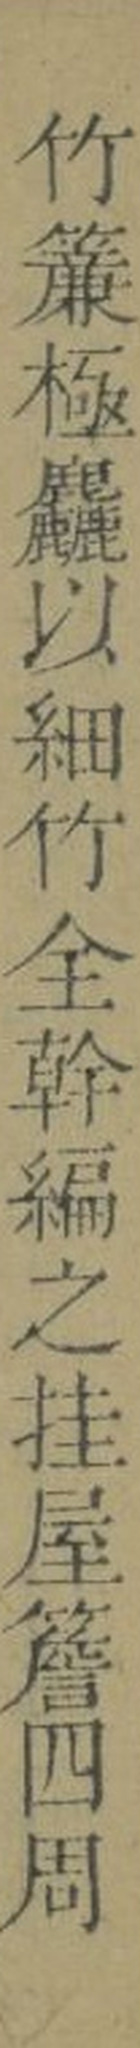竹簾極麤以細竹全幹編之挂屋簷四周
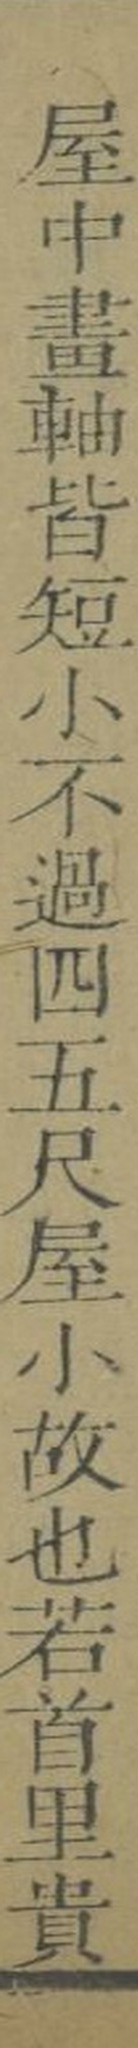屋中画軸皆短小不過四五尺屋小故也若首里貴
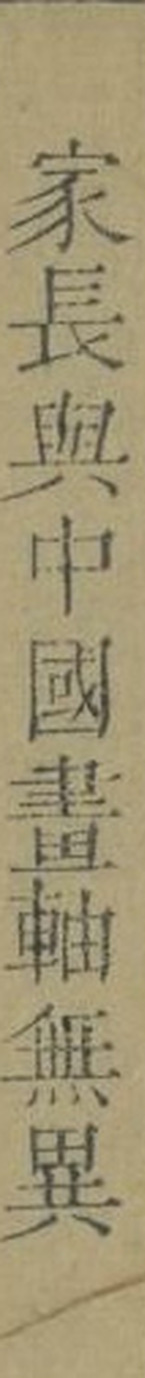家長与中国画軸無異
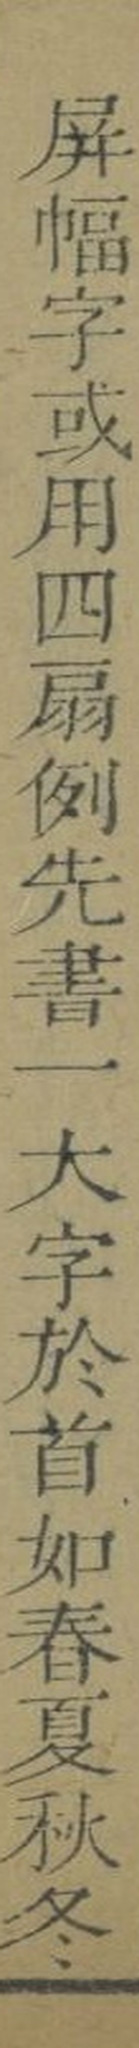屛幅字或用四扇例先書一大字於首如春夏秋冬
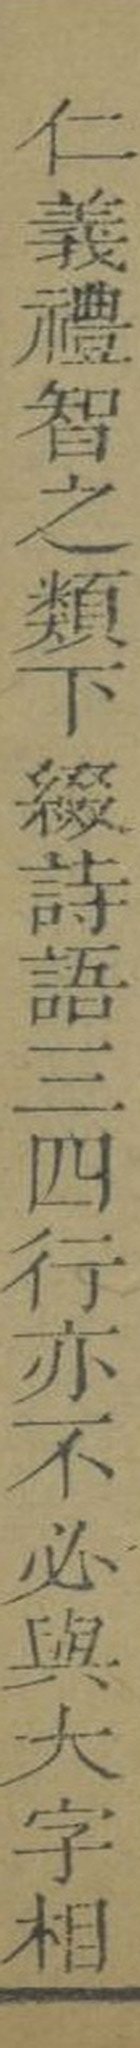仁義礼智之類下綴詩語三四行亦不必与大字相

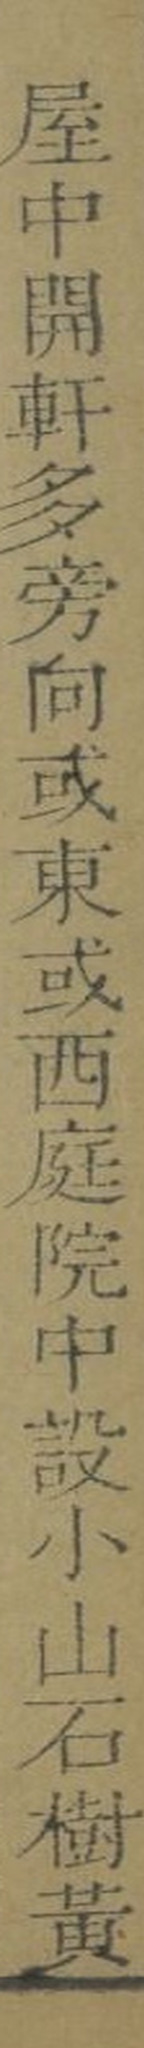屋中開軒多旁向或東或西庭院中設小山石樹黄
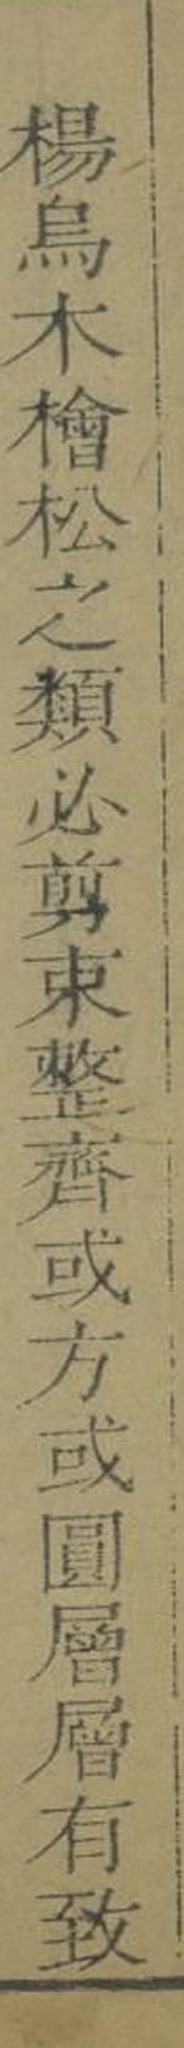楊烏木檜松之類必剪束整斉或方或円層層有致
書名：中山伝信録 巻六
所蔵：University of the Ryukyus Library
